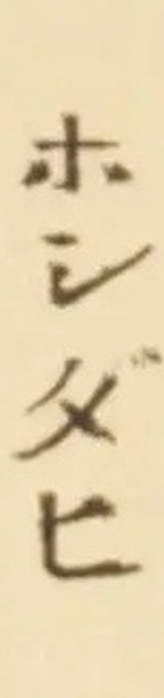ホシダヒ

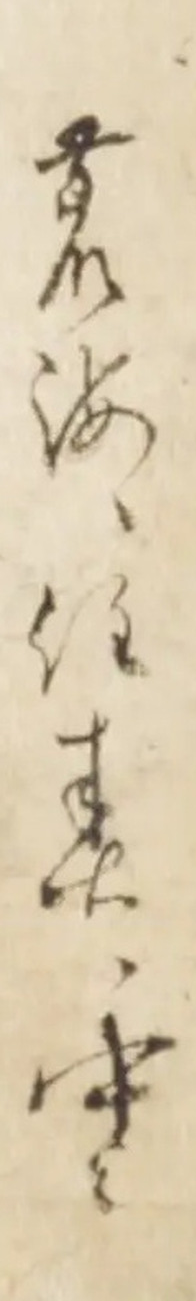荒海ニ住春ノ中ニ
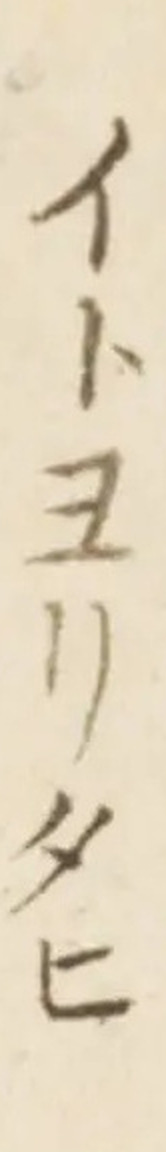イトヨリト云
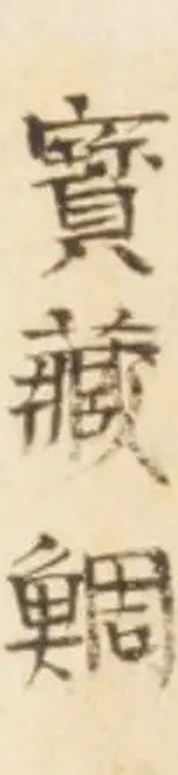宝蔵鯛
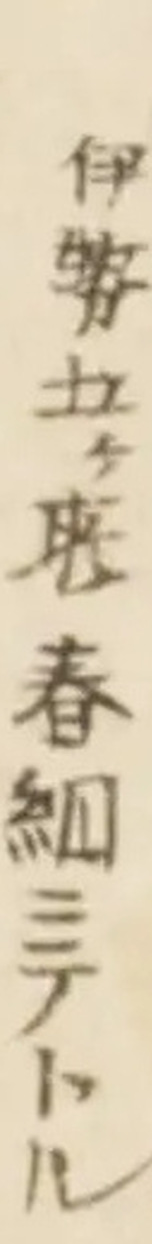伊勢五ヶ所春網？ニテトル
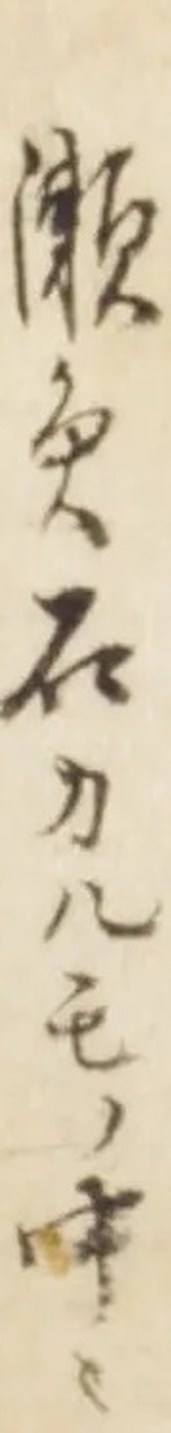瀬免石カルモノ中ニ

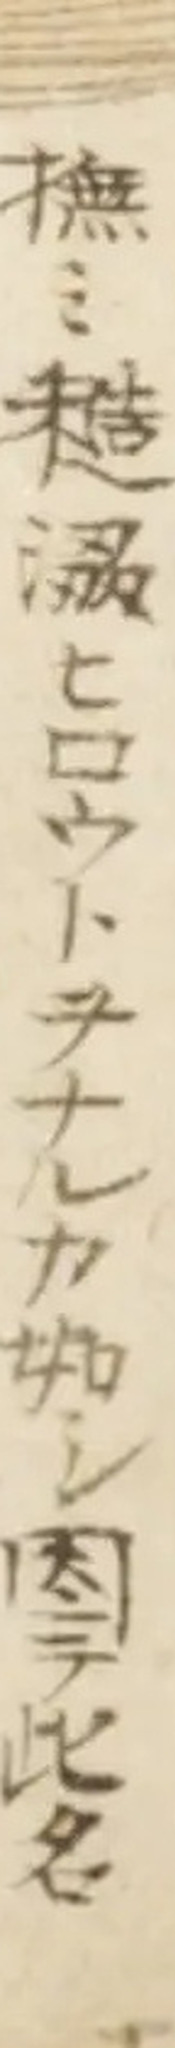撫ミ洲ヒロウトヲナルカ如シ因テ此名
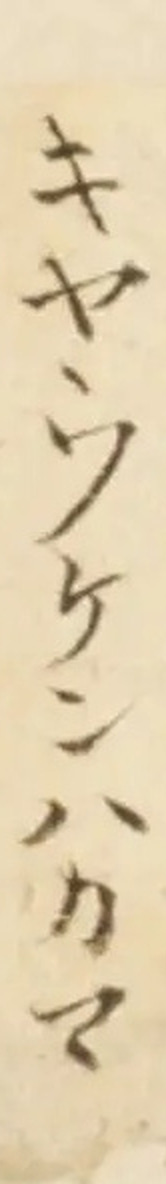キヤウケンハカマ
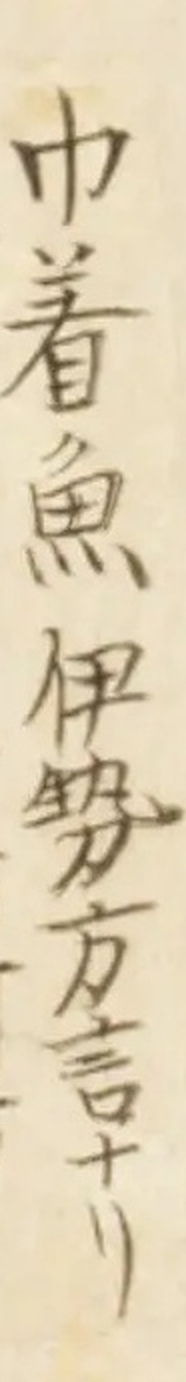巾着魚伊勢方言ナリ
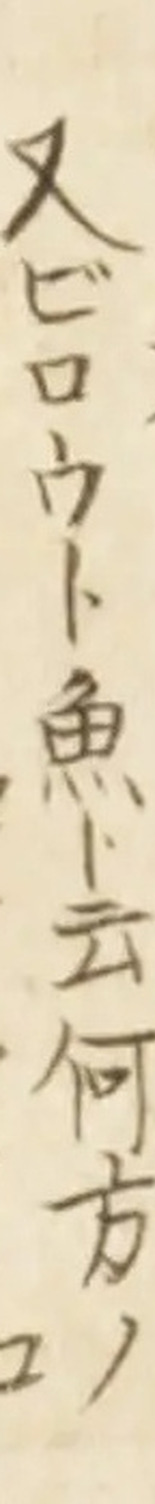又ビロウト魚ト云何方ノ
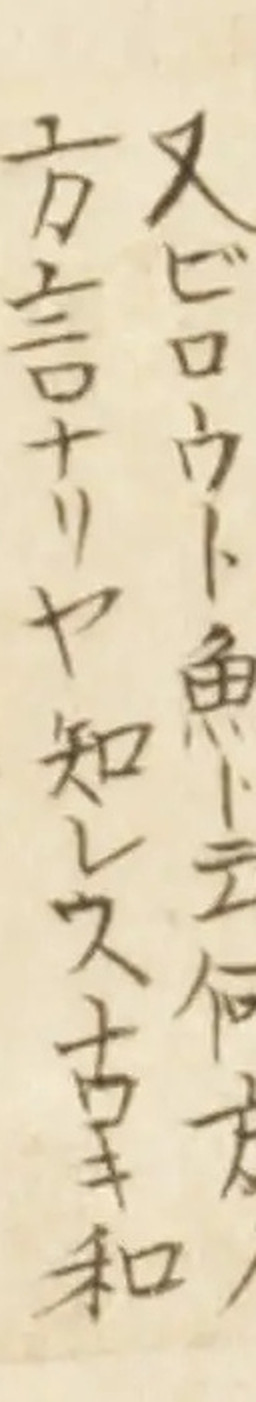方言ナリヤ知レス古キ和
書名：水族四帖. 夏
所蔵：国立国会図書館 National Diet Library, JAPAN
